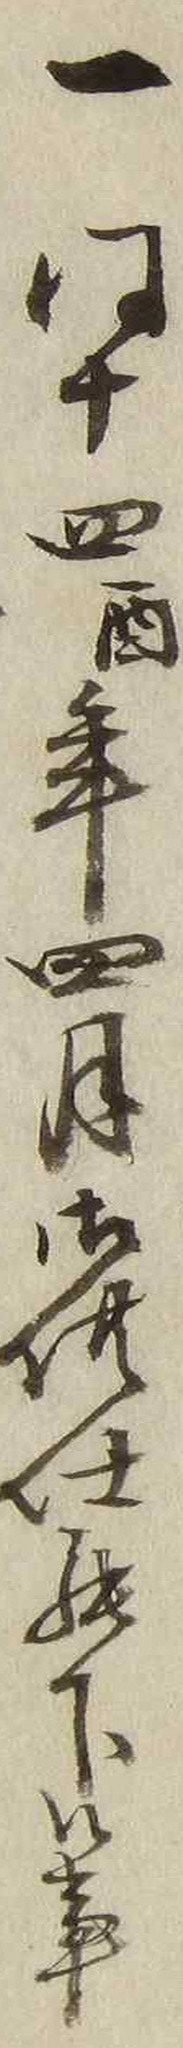一同十四酉年四月御供仕罷下候事
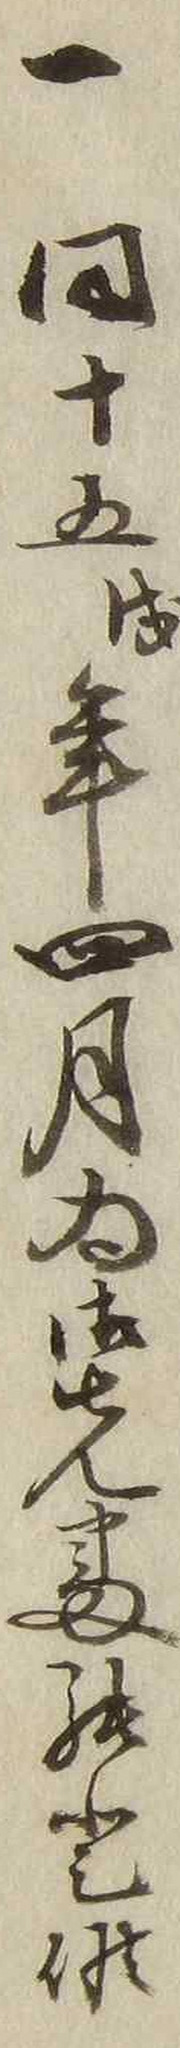一同十五戌年四月為御先番罷登候

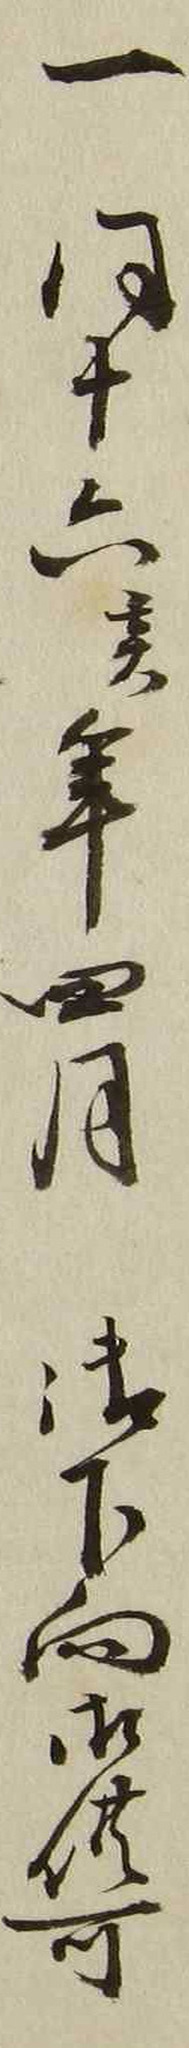一同十六亥年四月御下向御供可
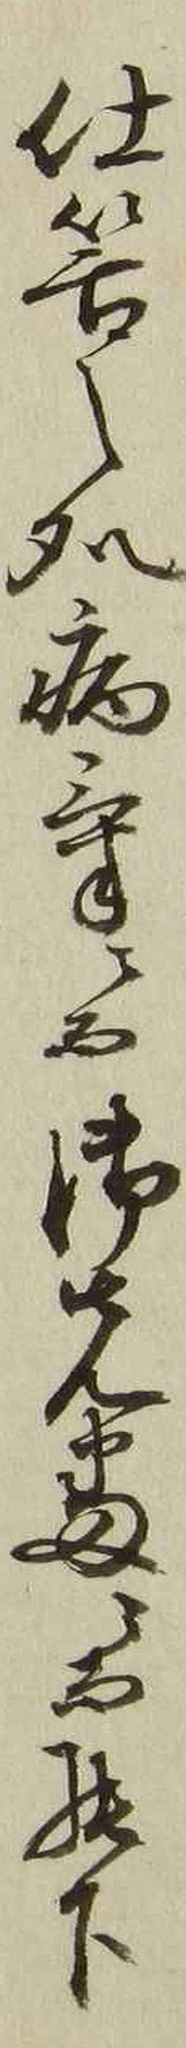仕筈之処病気ニ而御先番ニ而罷下
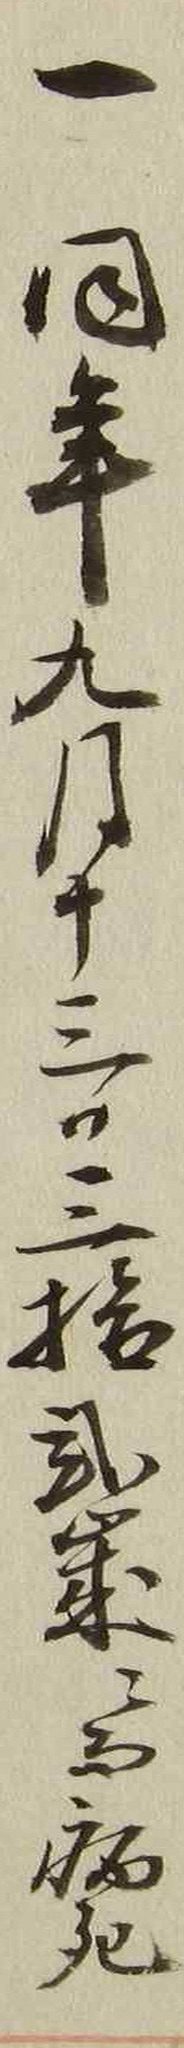一同年九月十三日三拾弐歳ニ而病死
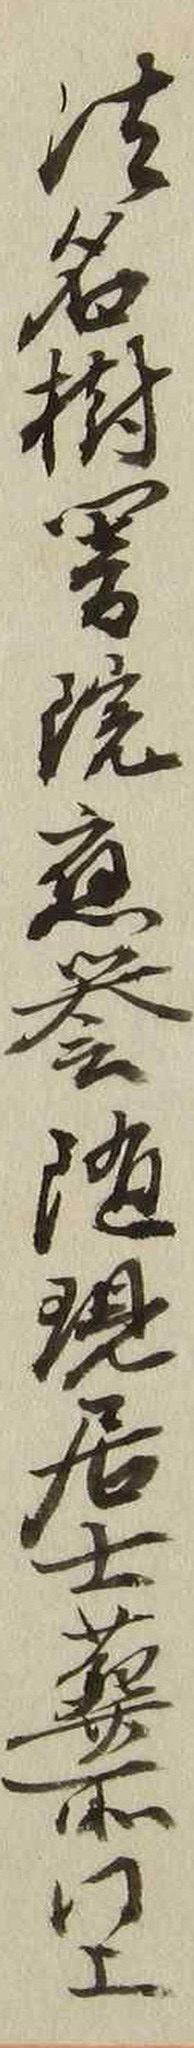法名樹闇院応誉随現居士葬所同上
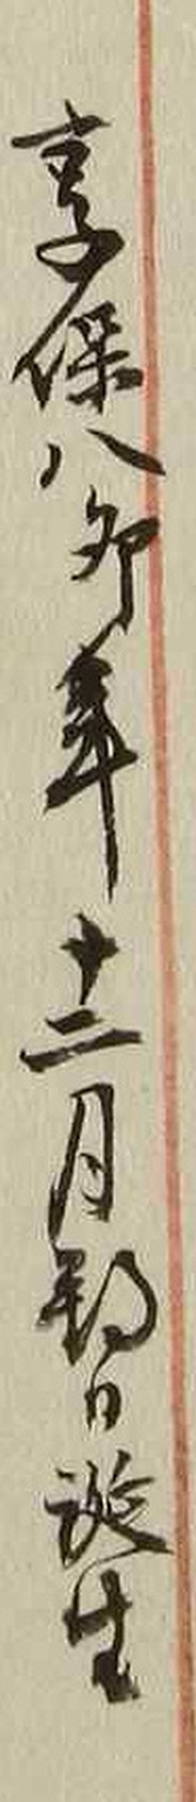享保八卯年十二月朔日誕生
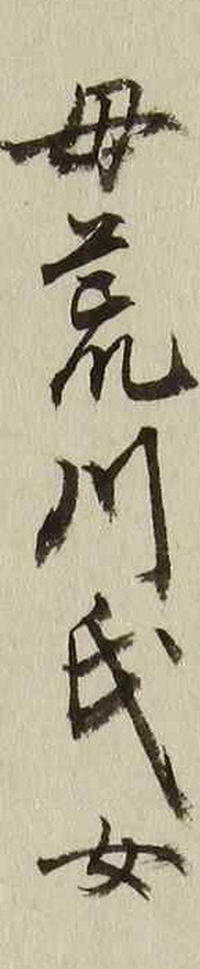母荒川氏女
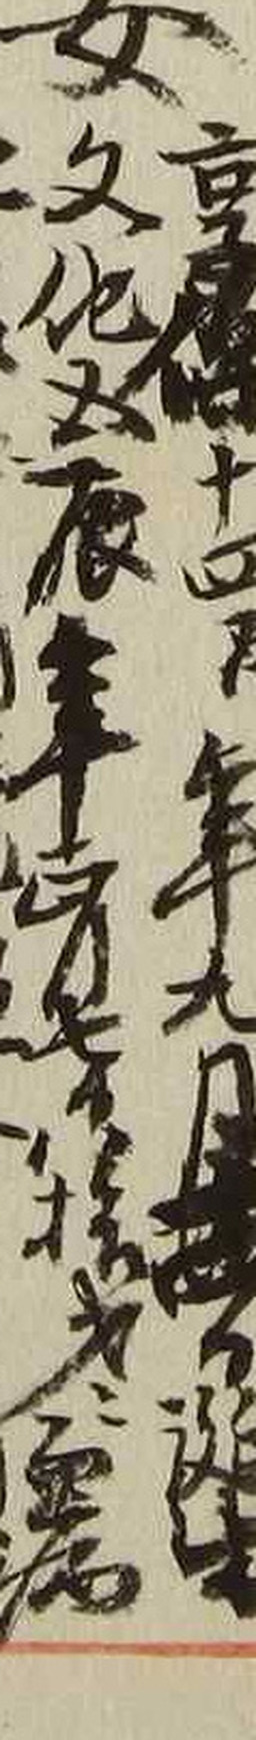文化五辰年正月七日八拾才ニ而病
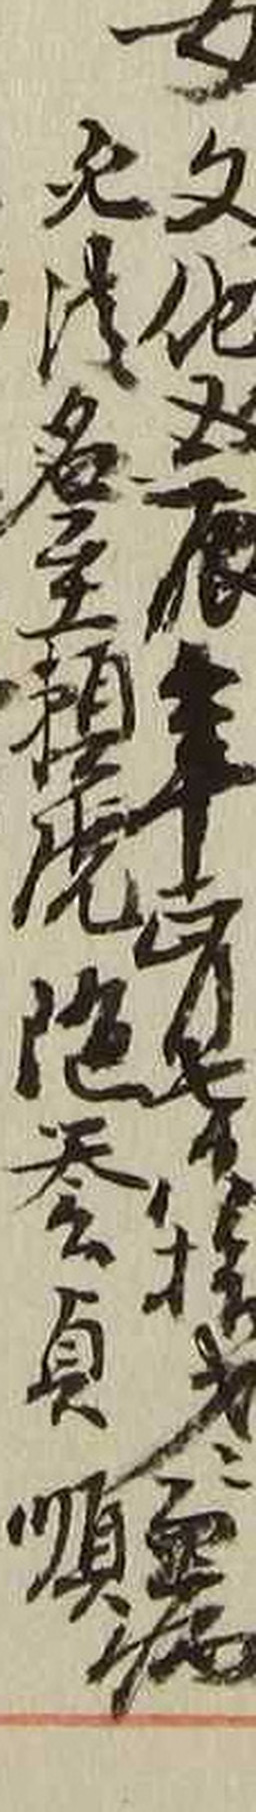死法名重頼院随誉貞順
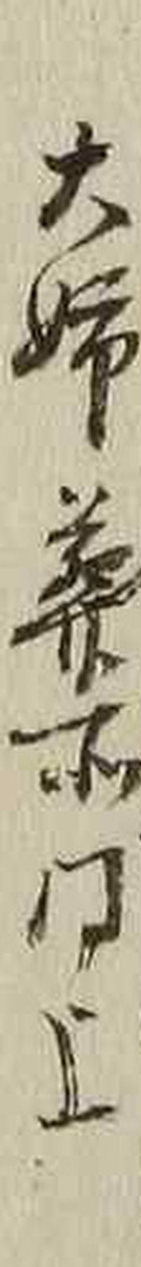大姉葬所同上
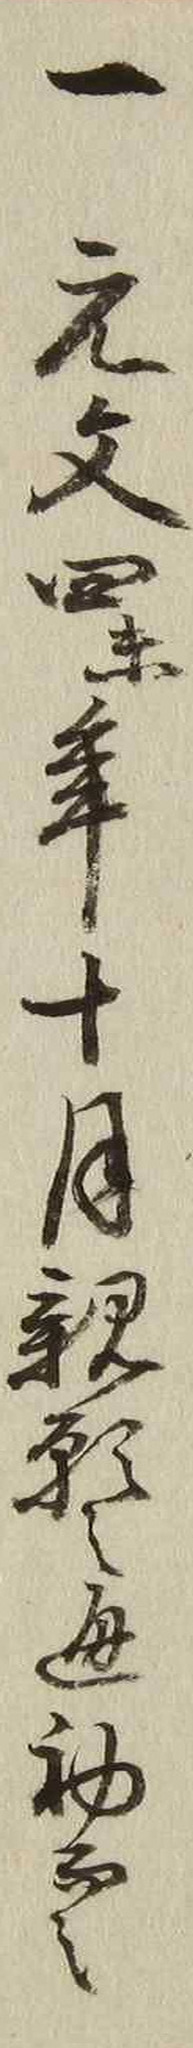一元文四未年十月親願之通初而之
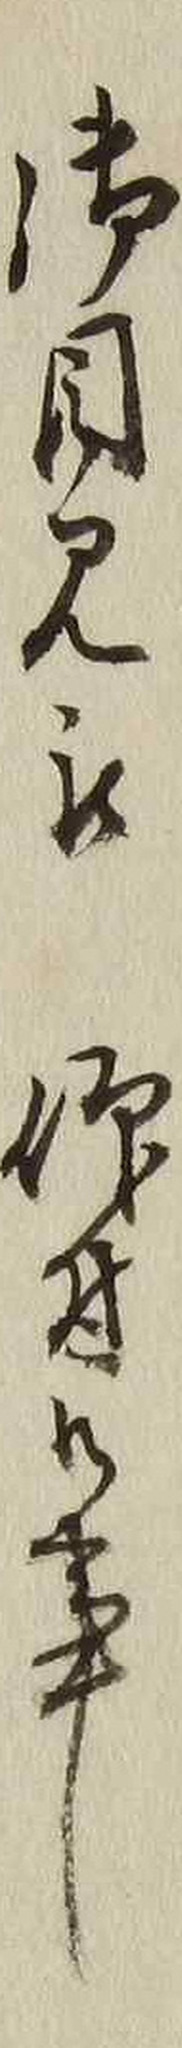御目見被仰付候事
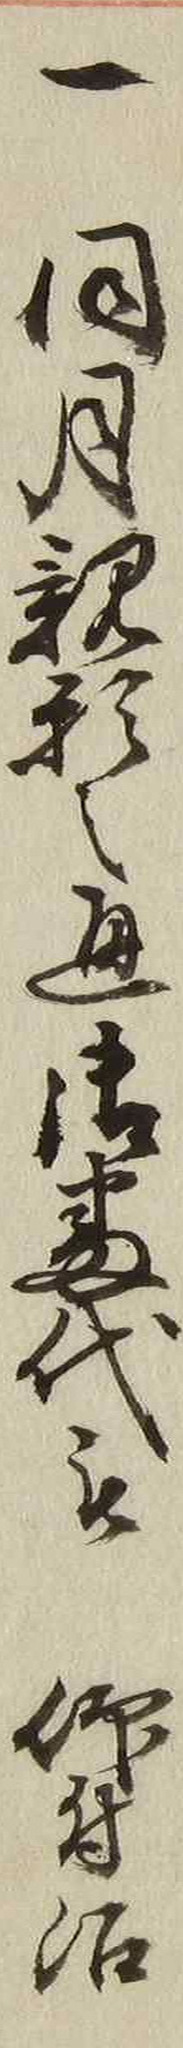一同月親願之通御番代被仰付沼
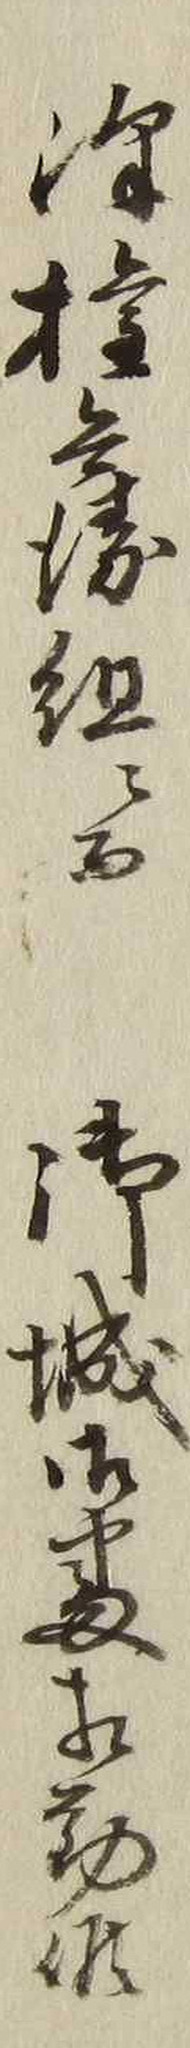沢権兵衛組ニ而御城御番相勤候
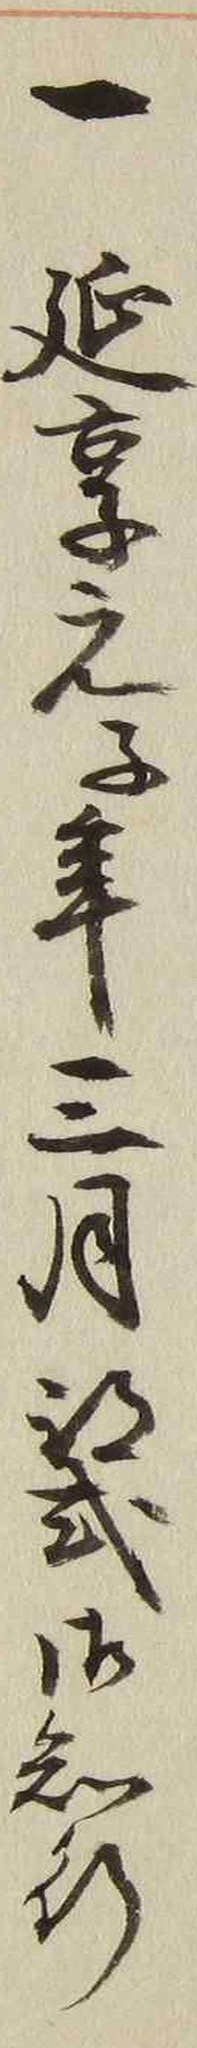一延享元子年三月跡式御知行
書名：諸士系譜　巻之23　い之部23
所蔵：会津若松市立会津図書館
